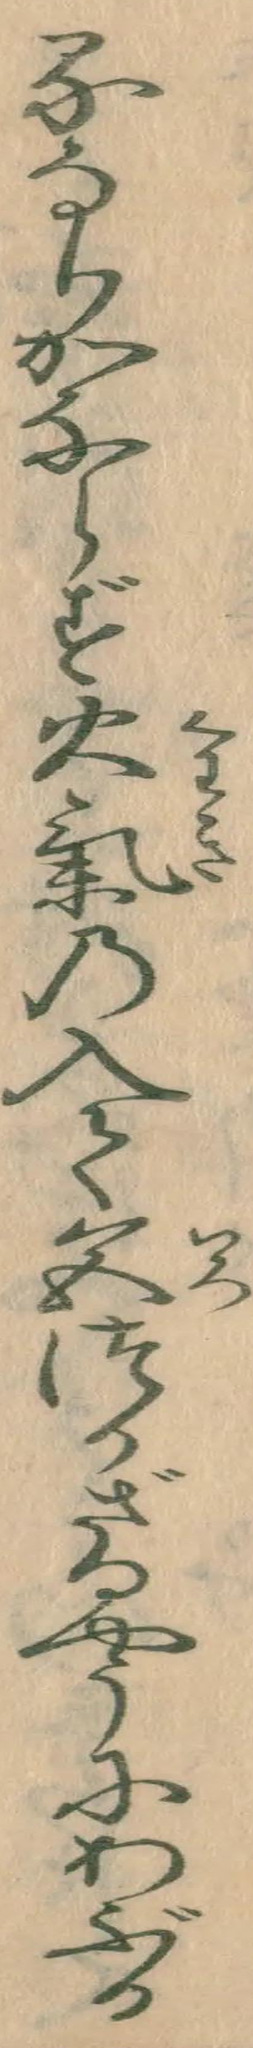るなりかならず火気の入て色つかざるやうにあぶる
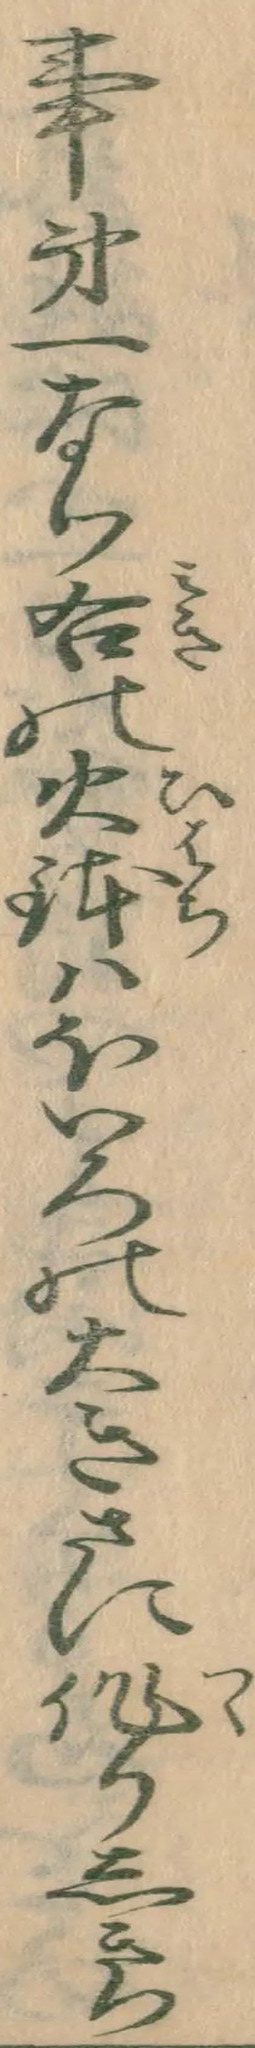事第一なり右の火鉢はほいろの大きさに作りしきり
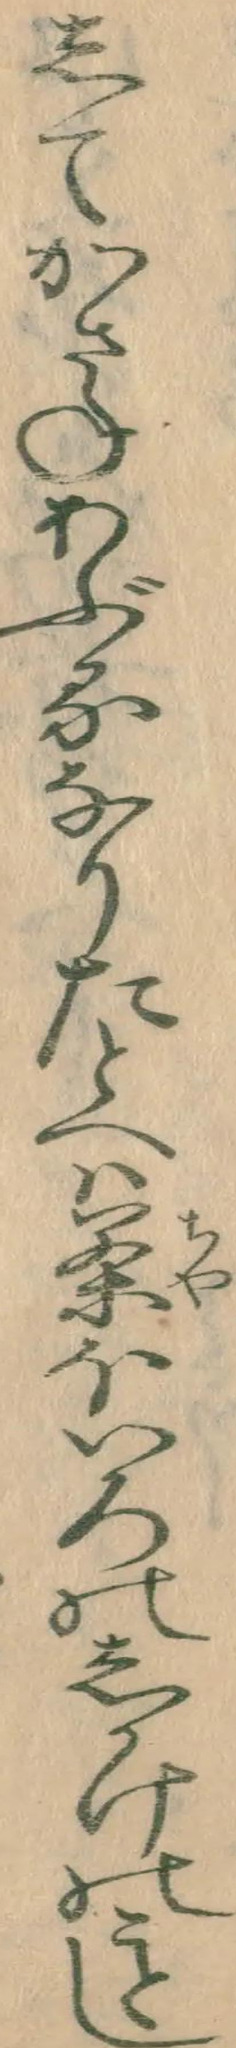してかさねあぶるなりたとへは茶ほいろのしかけのことし
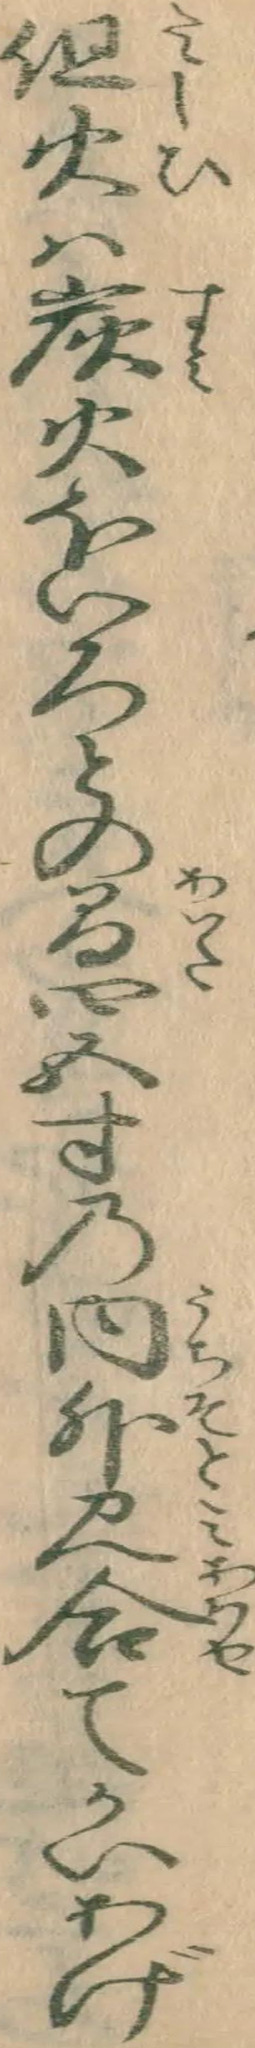但火は炭火ほいろとの間四五寸の内外見合てかいあげ
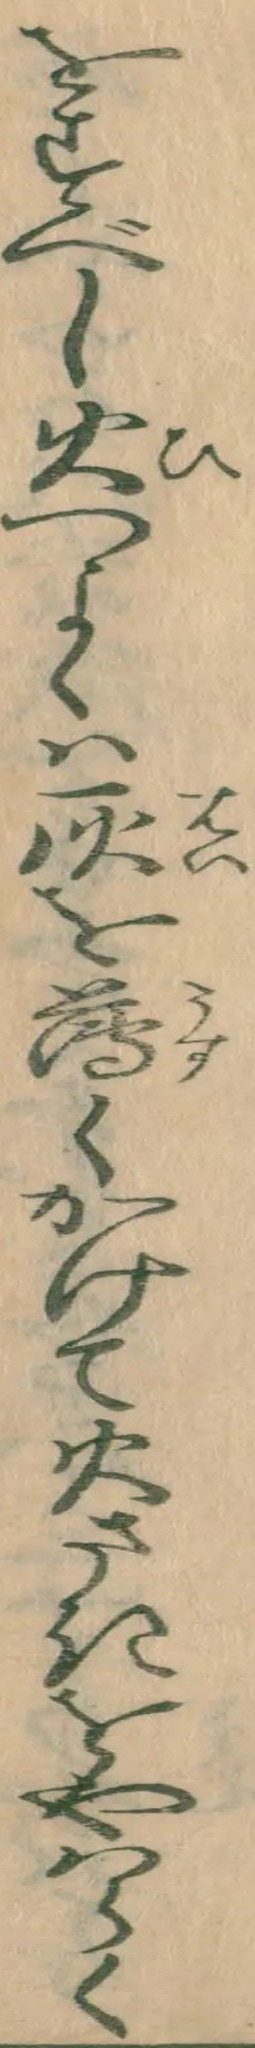をすべし火つよくは灰を薄くかけて火さきをやはらく

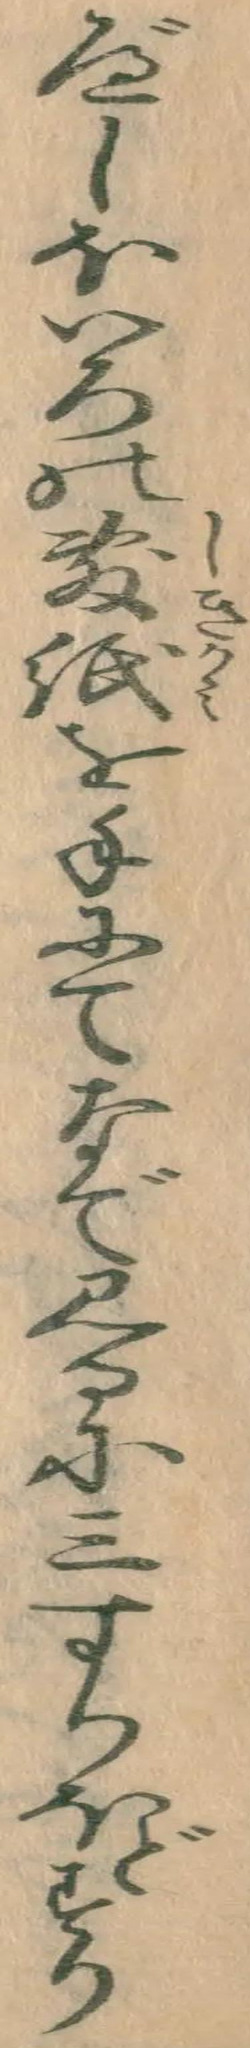べしほいろの敷紙を手にてなで見るに三すりほどすり
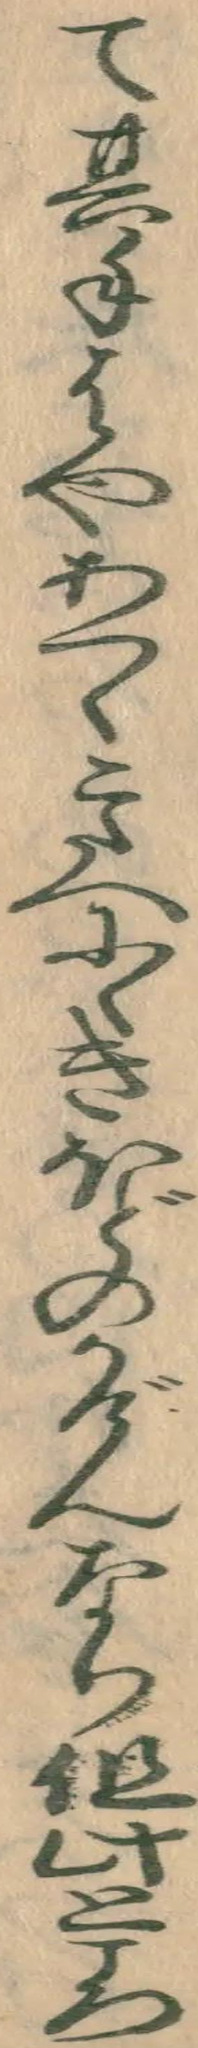て其手はやあつくこたへにくきほどのかげんなり但此ところ
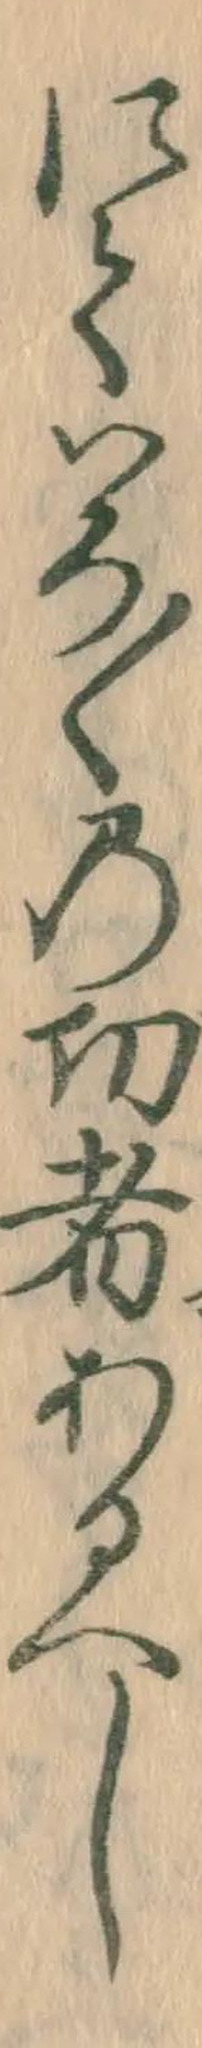にていろ〳〵の功者あるへし
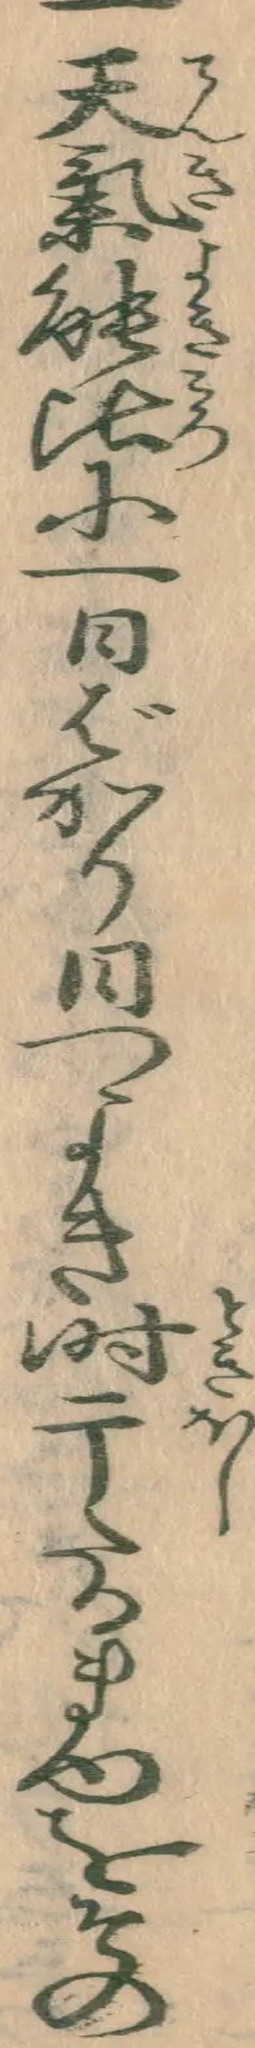一天気能比に一日ばかり日つよき時干たるまゆをその
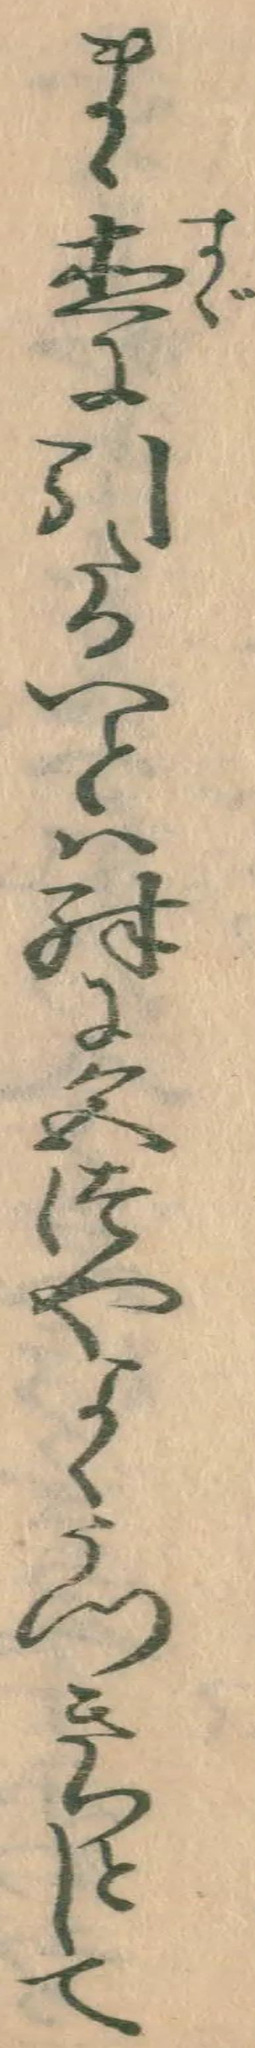まゝ直に引たるいとは殊に色つやよくうつきりとして
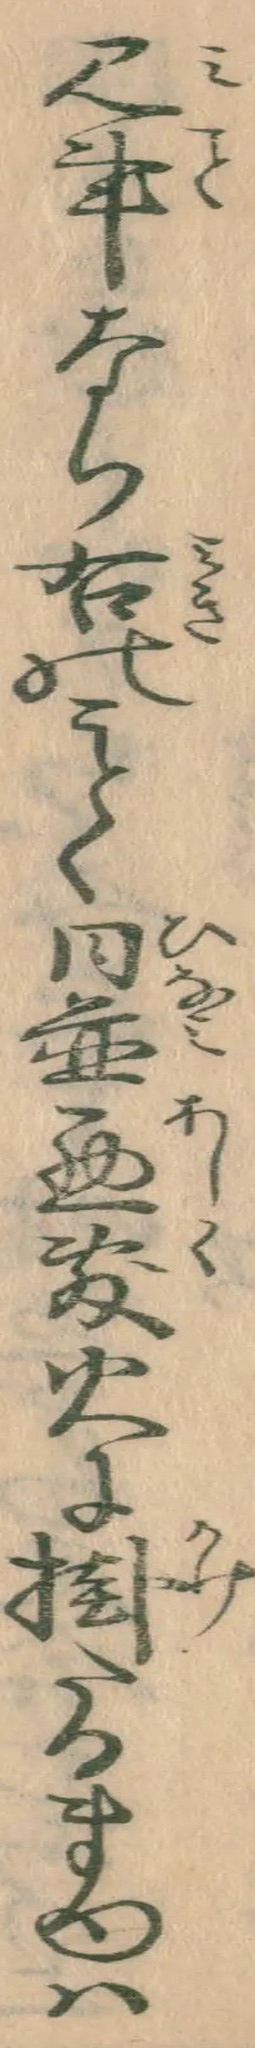見事なり右のことく日並悪敷火に掛たるまゆは
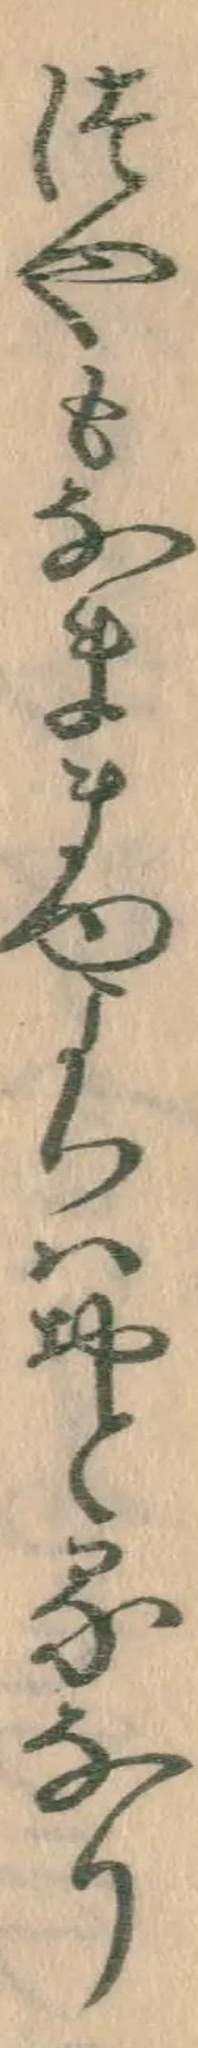つやもなままゆよりはおとるなり
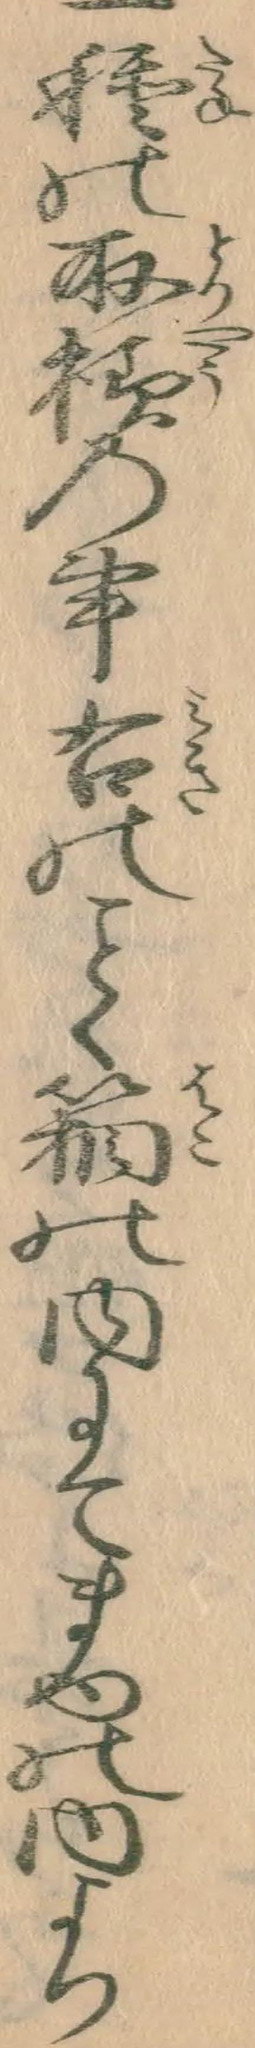一種の取様の事右のことく箱の内にてまゆの内より
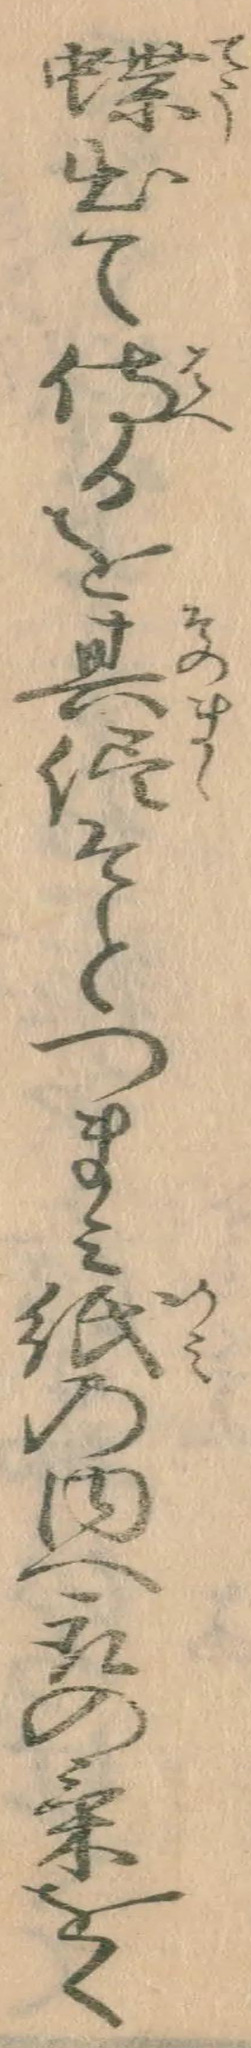蝶出て侍るを其侭そとつまみ紙の内へ取のきをく
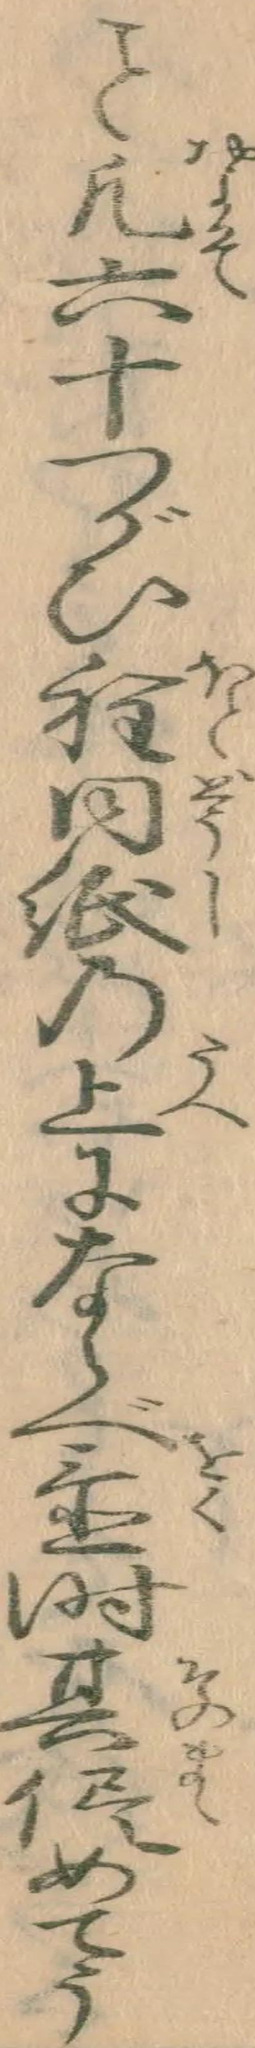こと凡六十つがひ程同紙の上にならべ置時其侭めてう
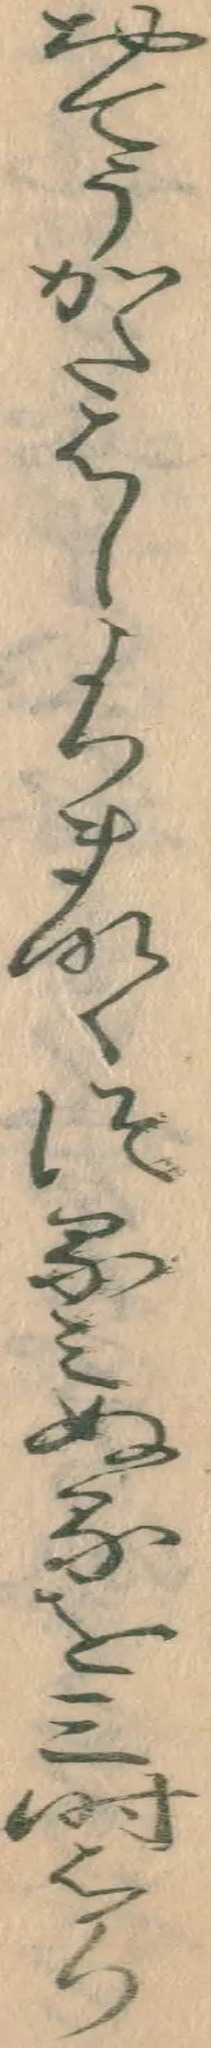おてうかたはしよりまなくつるみぬるを三時はかり
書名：蚕飼養法記
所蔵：国立国会図書館 National Diet Library, JAPAN
